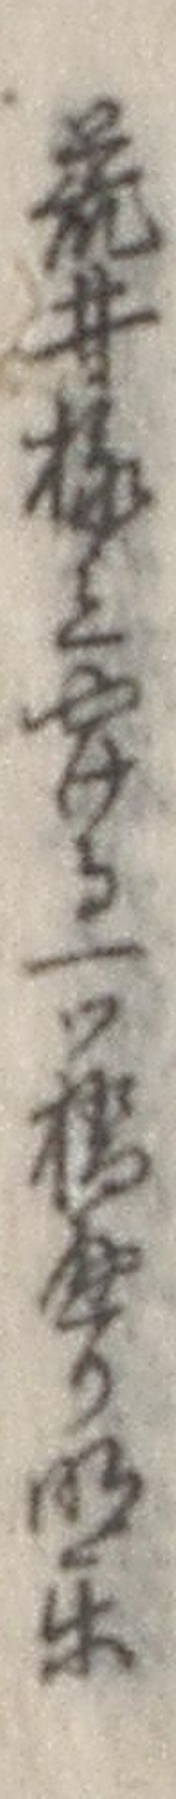荒井様迄やける一ツ橋通り明楽
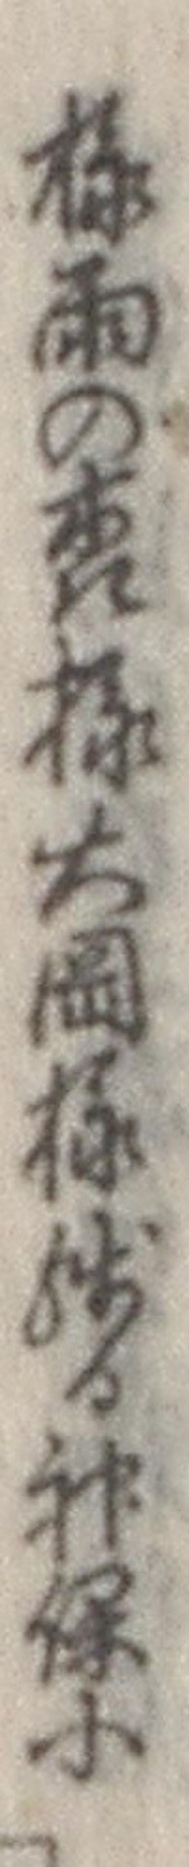様雨の森様大岡様残る神保小
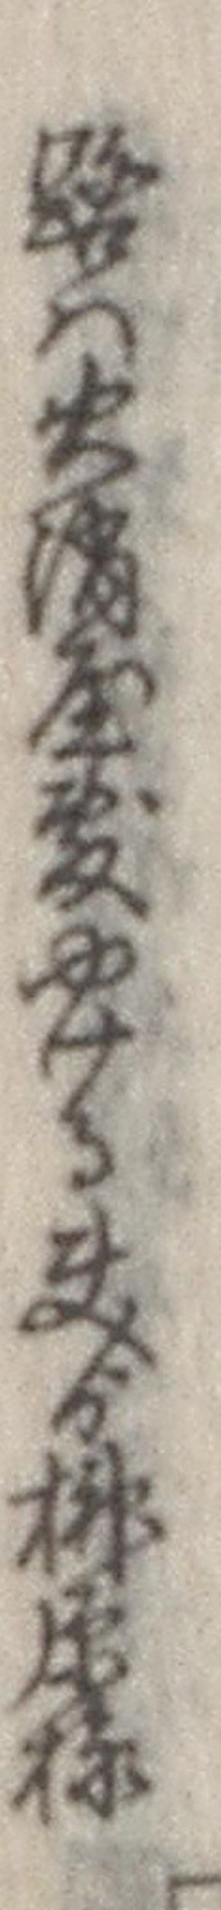路は火消屋敷やける夫ゟ柳原様
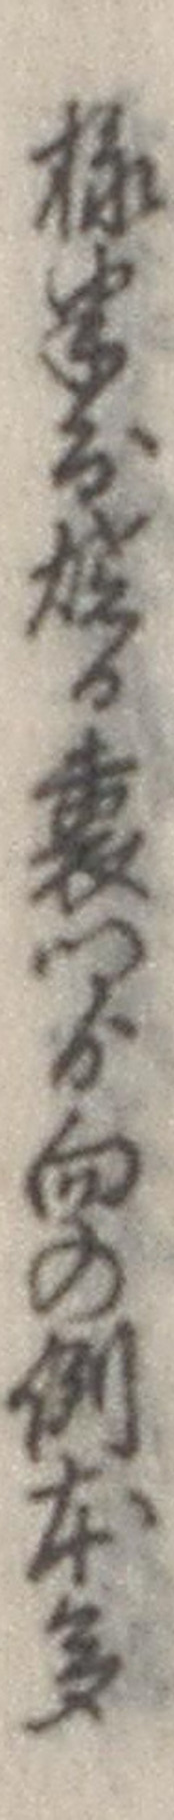様半分焼る裏門ゟ向の側本多
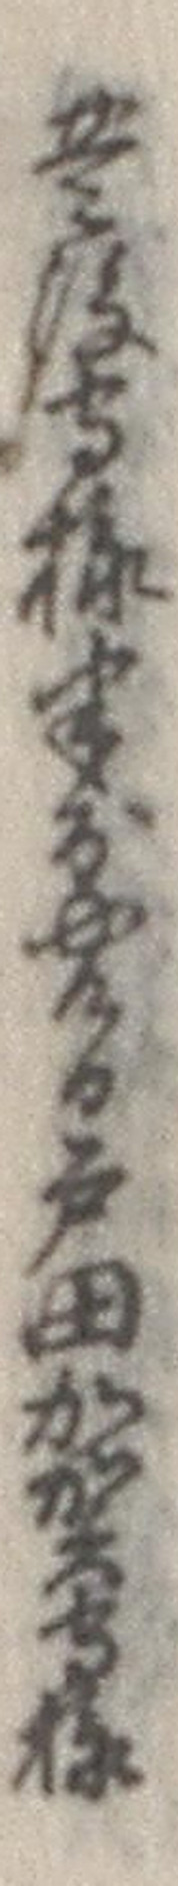豊後守半分やける戸田加賀守様
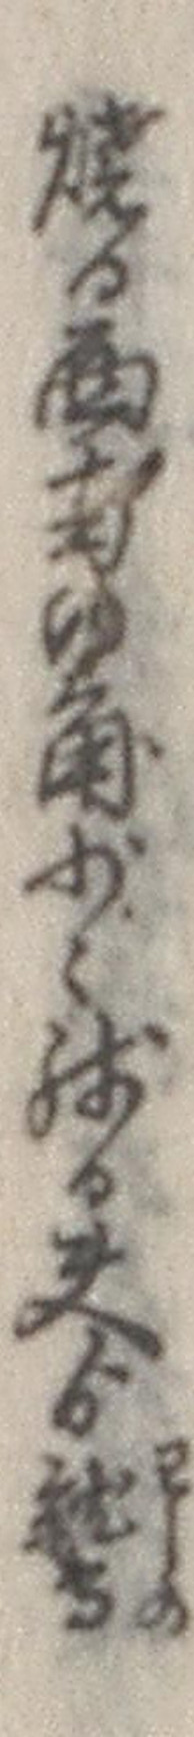焼る西南の角少〻残る夫ゟ-鷲
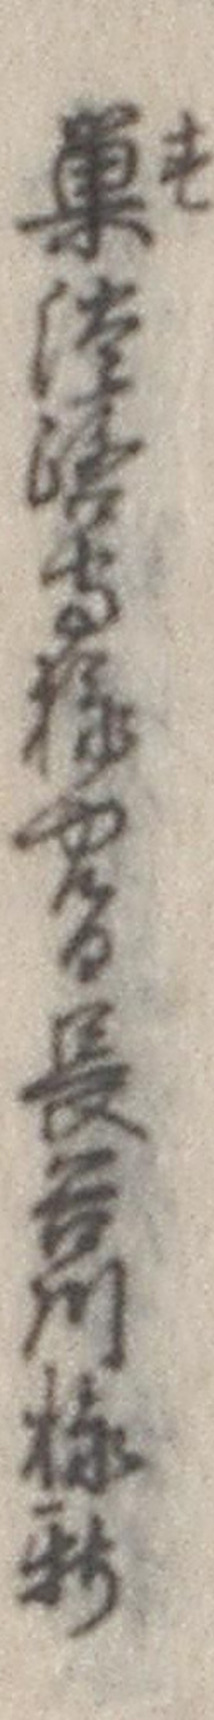-巣淡路守様やける長谷川様新
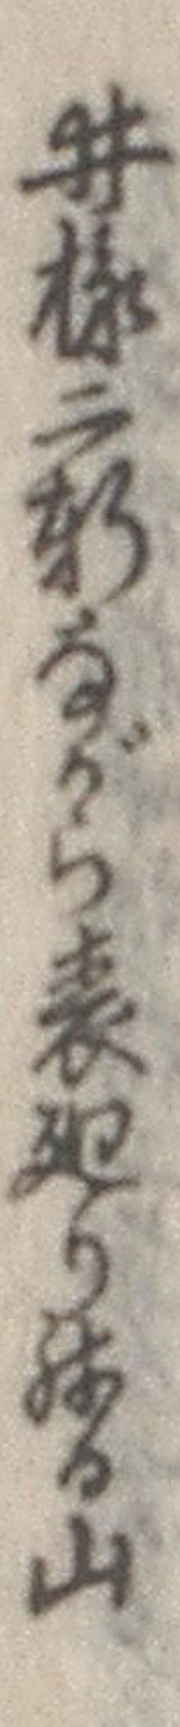井様二軒ながら表廻り残る山
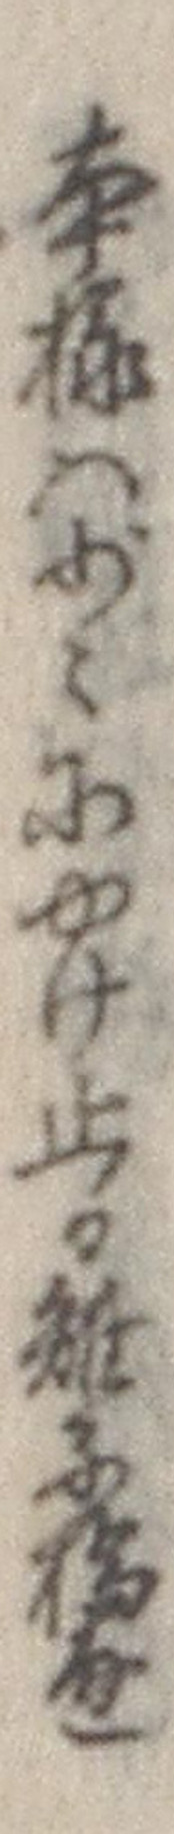本様は少〻にやけ止る雉子橋通
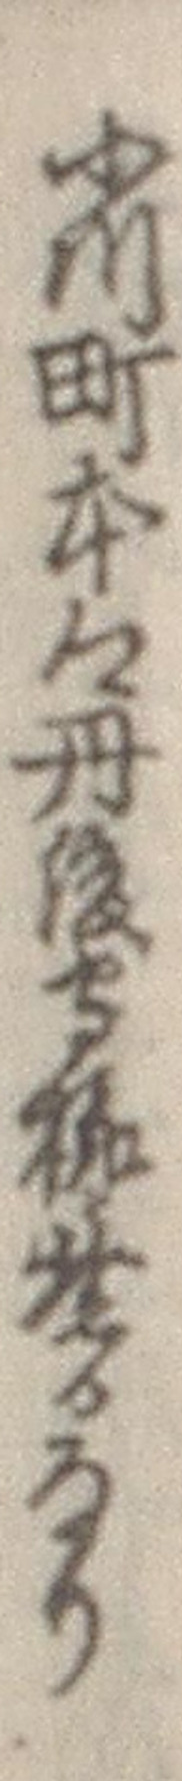小川町本郷丹後守様焼るなり
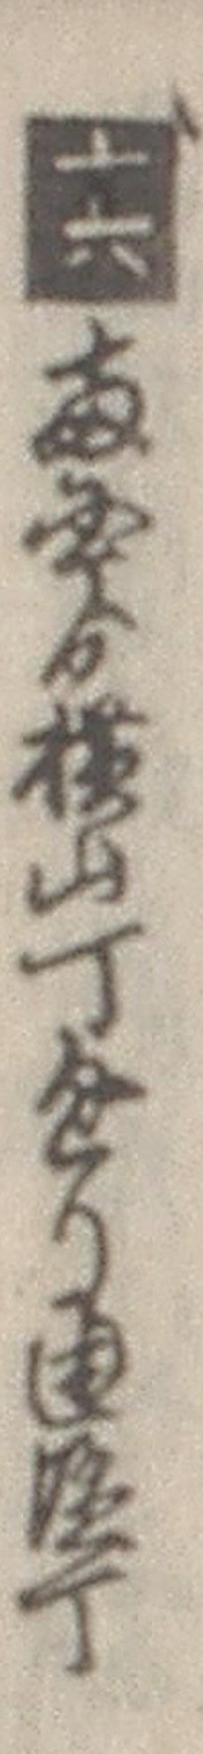十六南西ゟ横山丁通り通堀丁
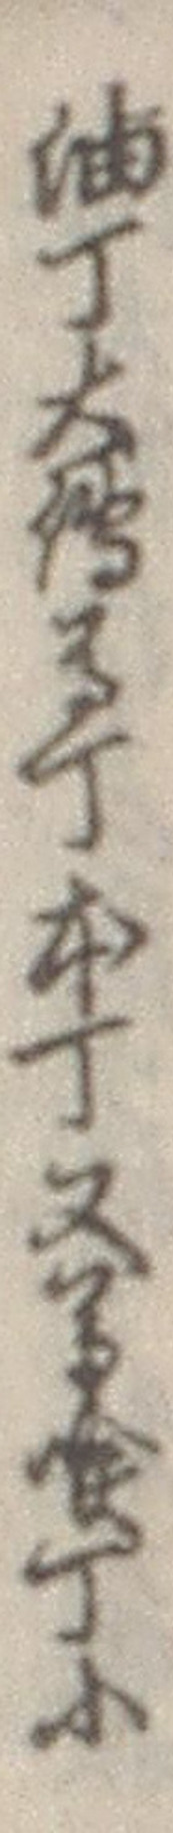油丁大傳馬丁本丁又馬喰丁小
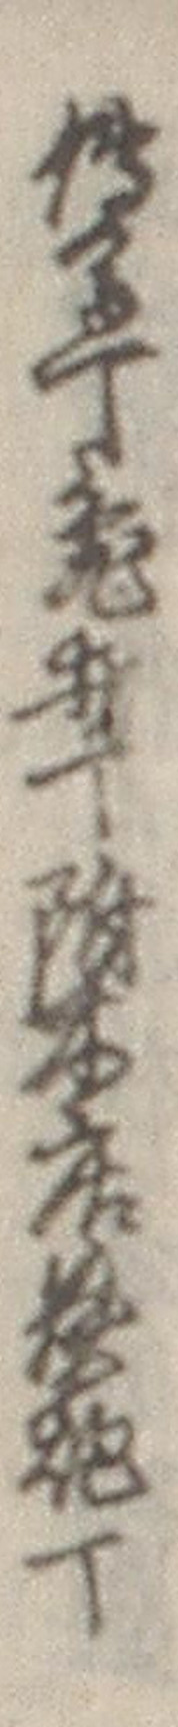傳馬丁亀井丁附木店鉄炮丁
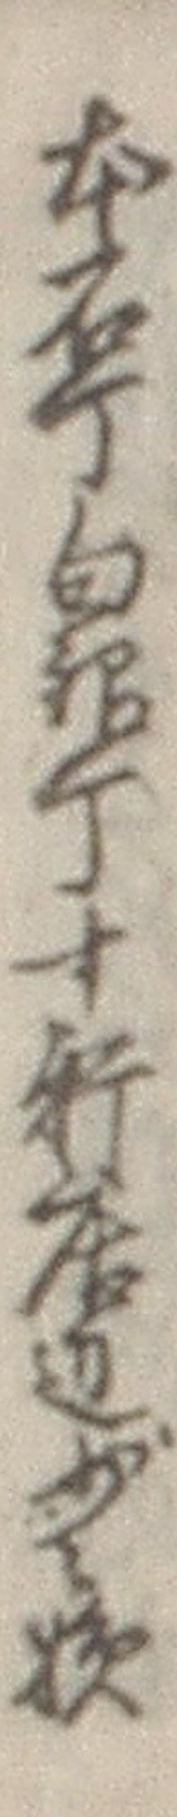本石丁白銀丁十軒店辺少〻損
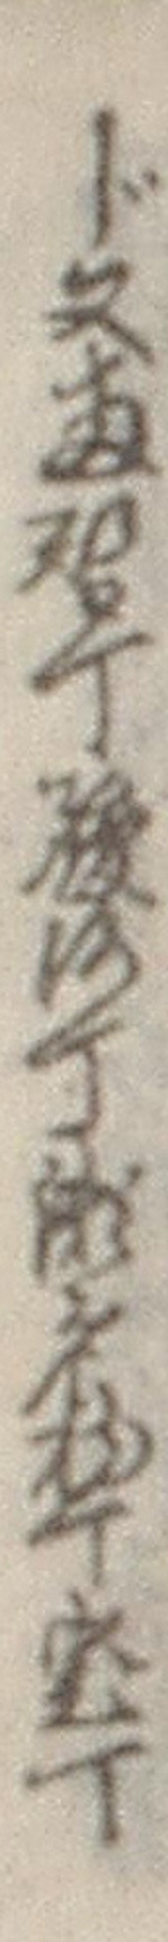じ又両替丁駿河丁瀬戸物丁室丁
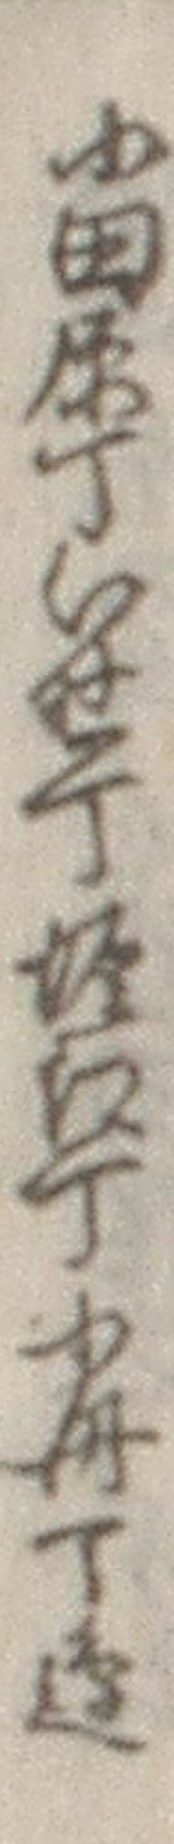小田原丁いせ丁堀江丁小舟丁邊
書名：江戸　大地震臣細録　全
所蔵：東京大学地震研究所図書室 Earthquake Research Institute Library, The University of Tokyo, JAPAN
